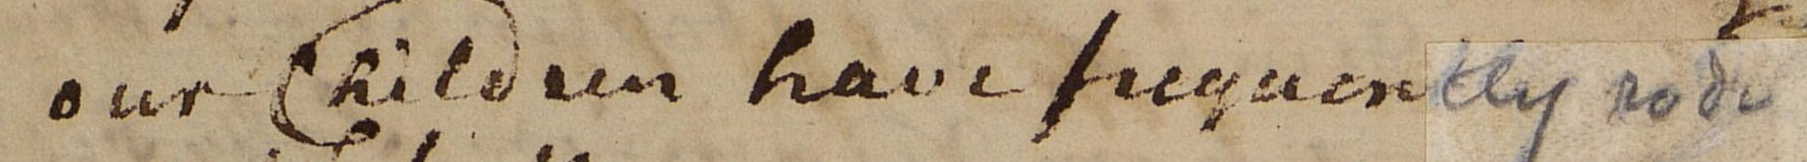our Children have frequently rode
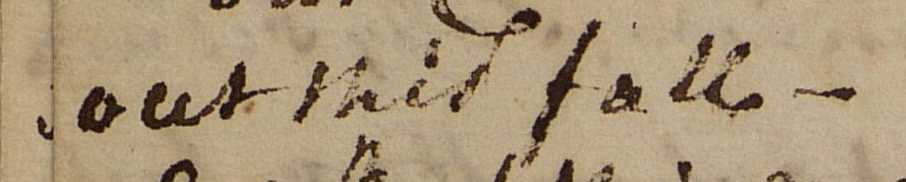out this fall-
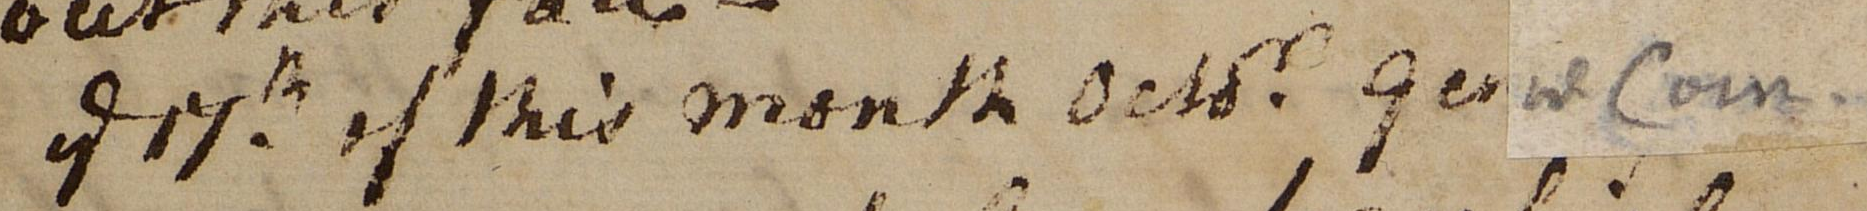y^e 17^th. of this month Oct^r. gen^l Corn-
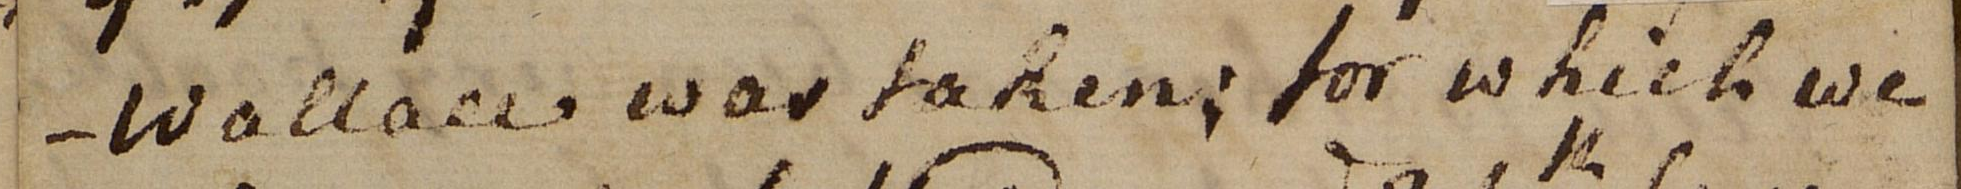-Wallace was taken; for which we
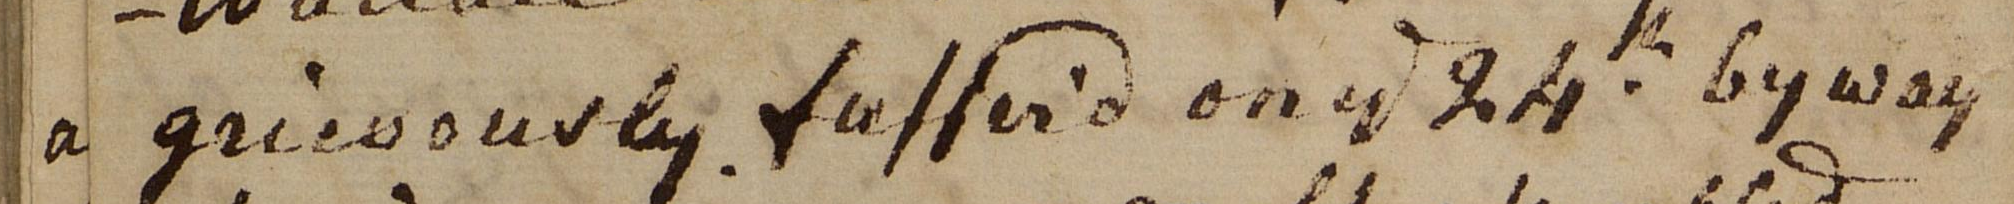grievously suffer'd on y^e 24^th by way
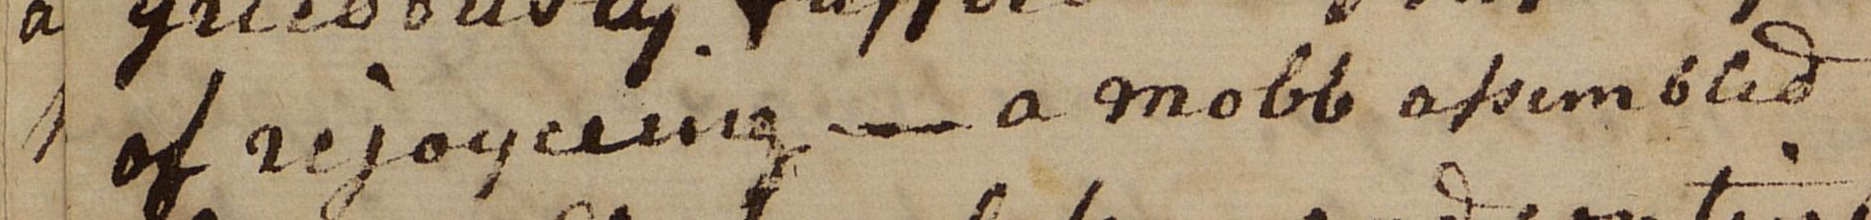of rejoyceing- a mobb assembled
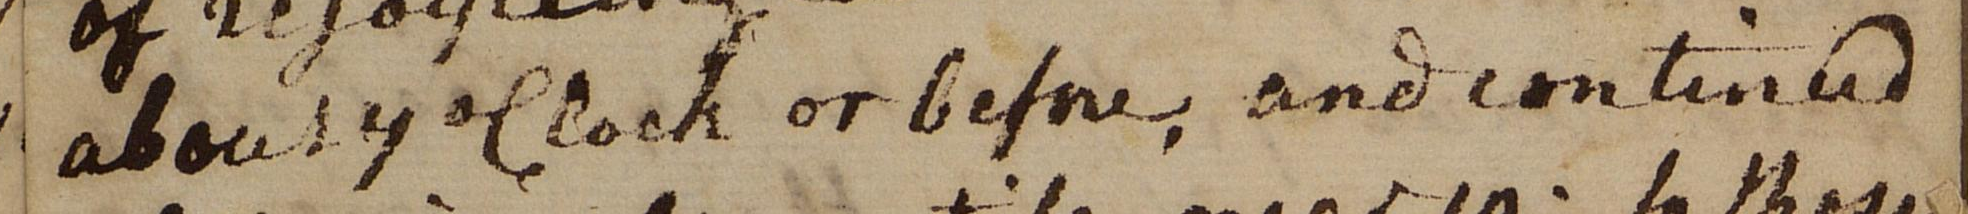about 7 ^o Clock or before, and continud
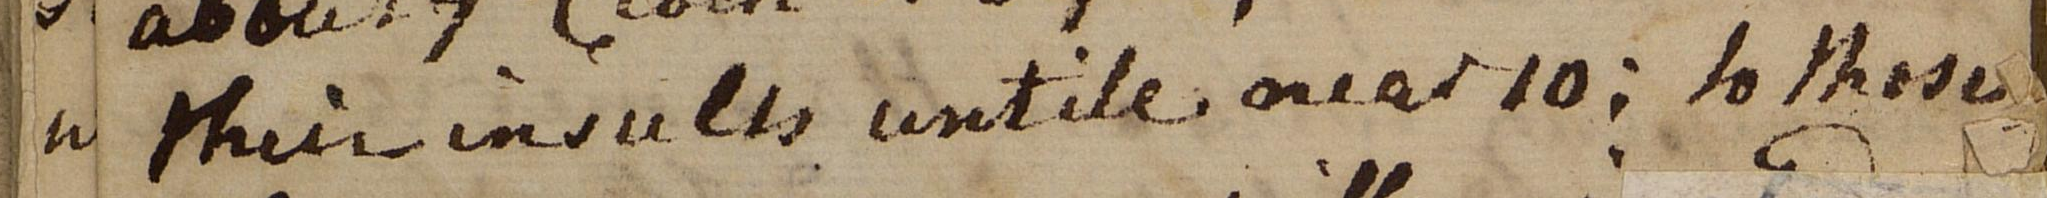their insults untill near 10; to those
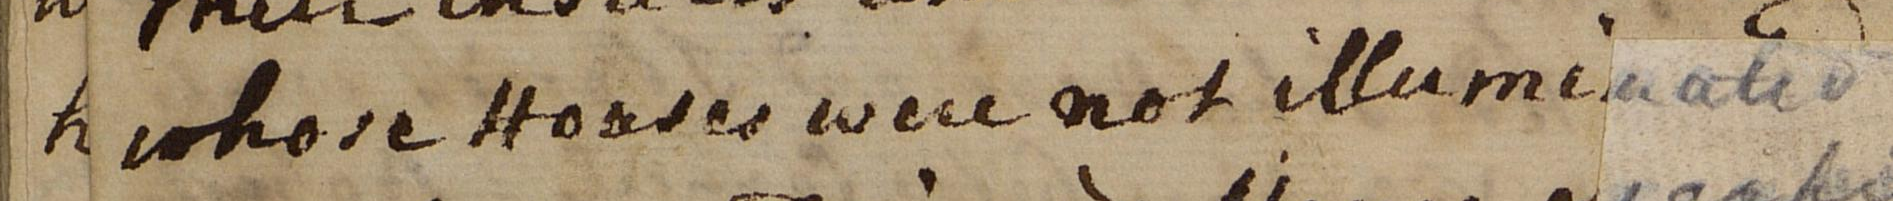whose Houses were not illuminated
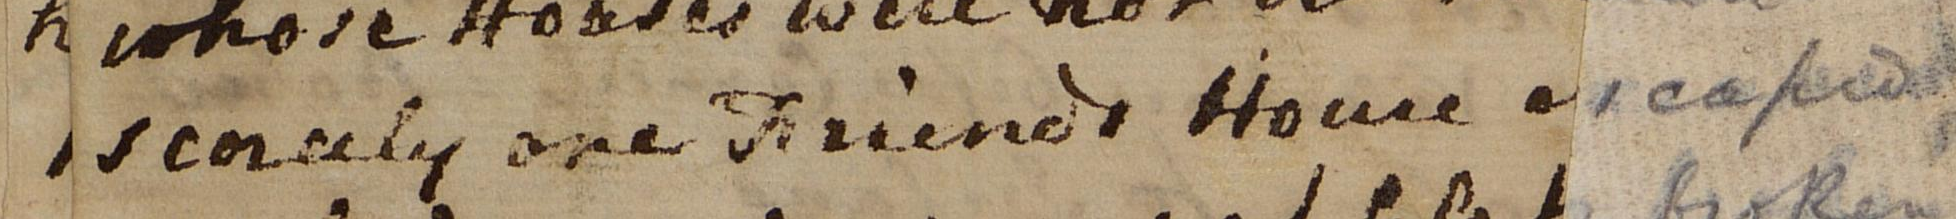scarcely one Friends House escaped
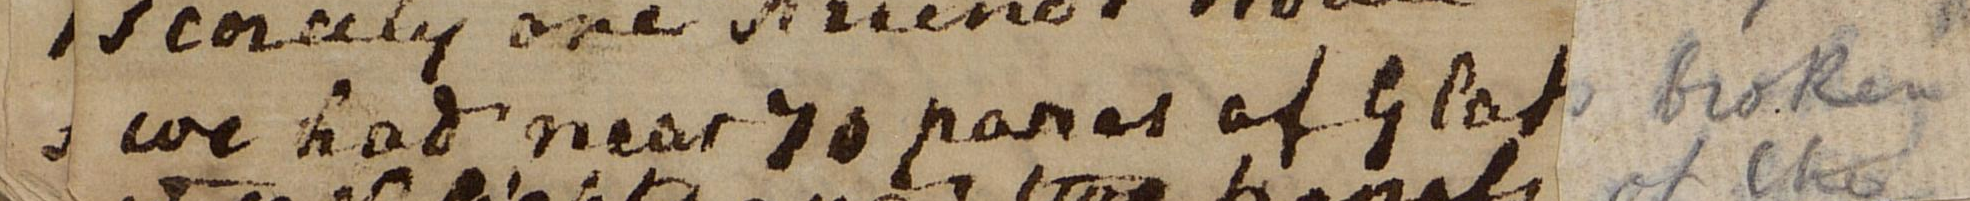we had near 70 panes of Glass broken
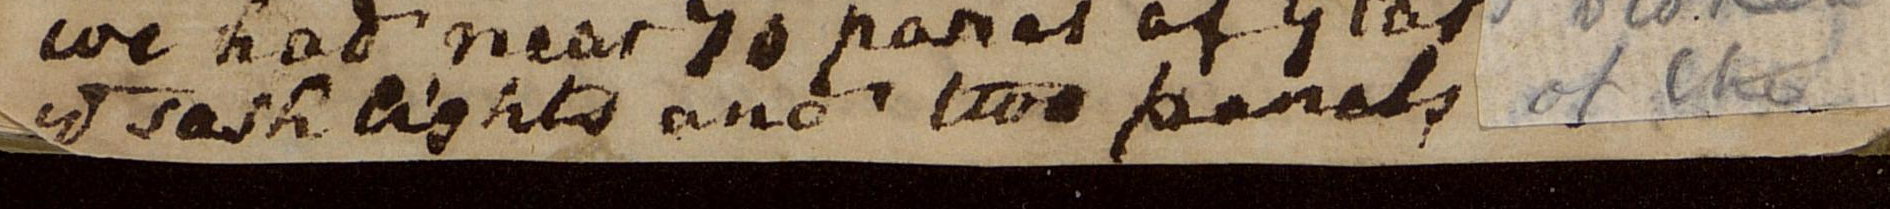y^e sash lights and two panels of the
